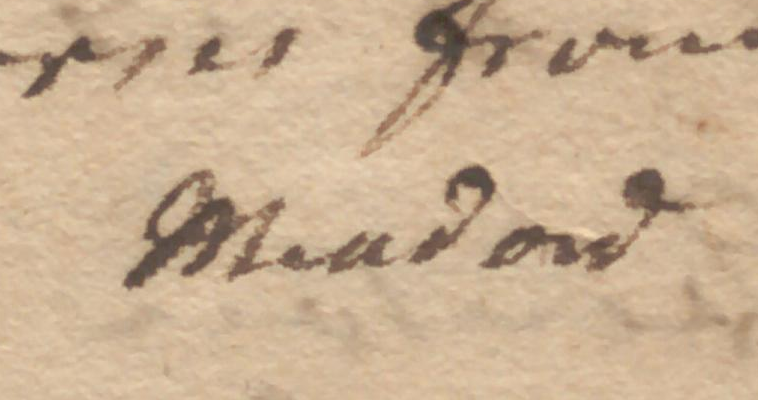Meadow
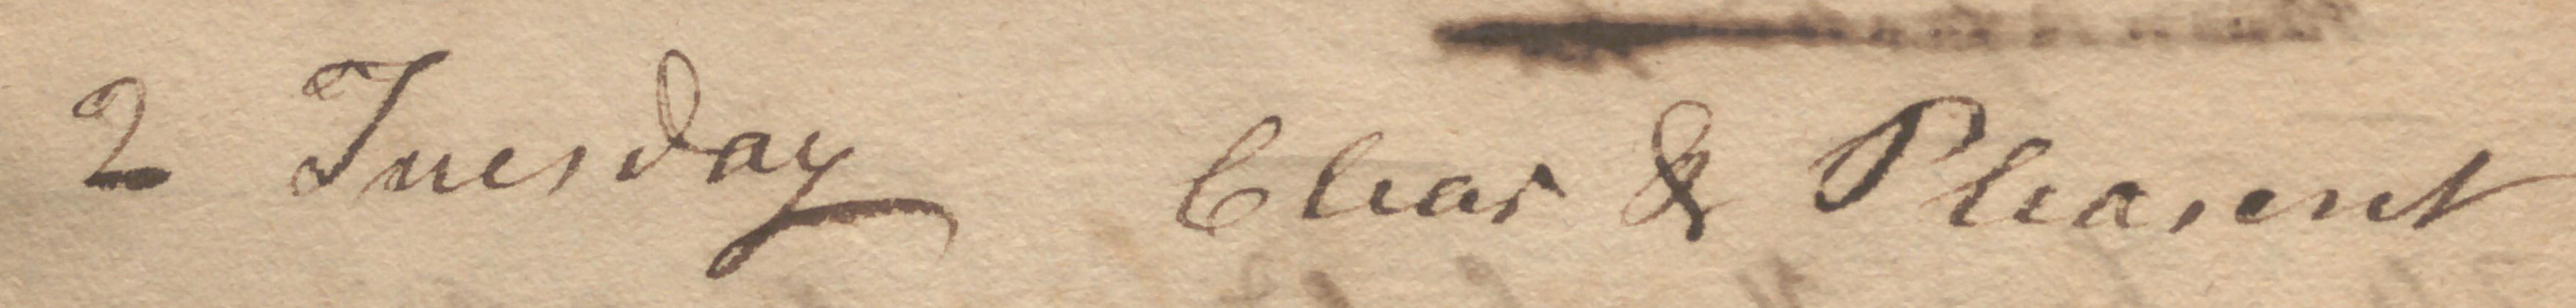2 Tuesday Clear & Pleasent
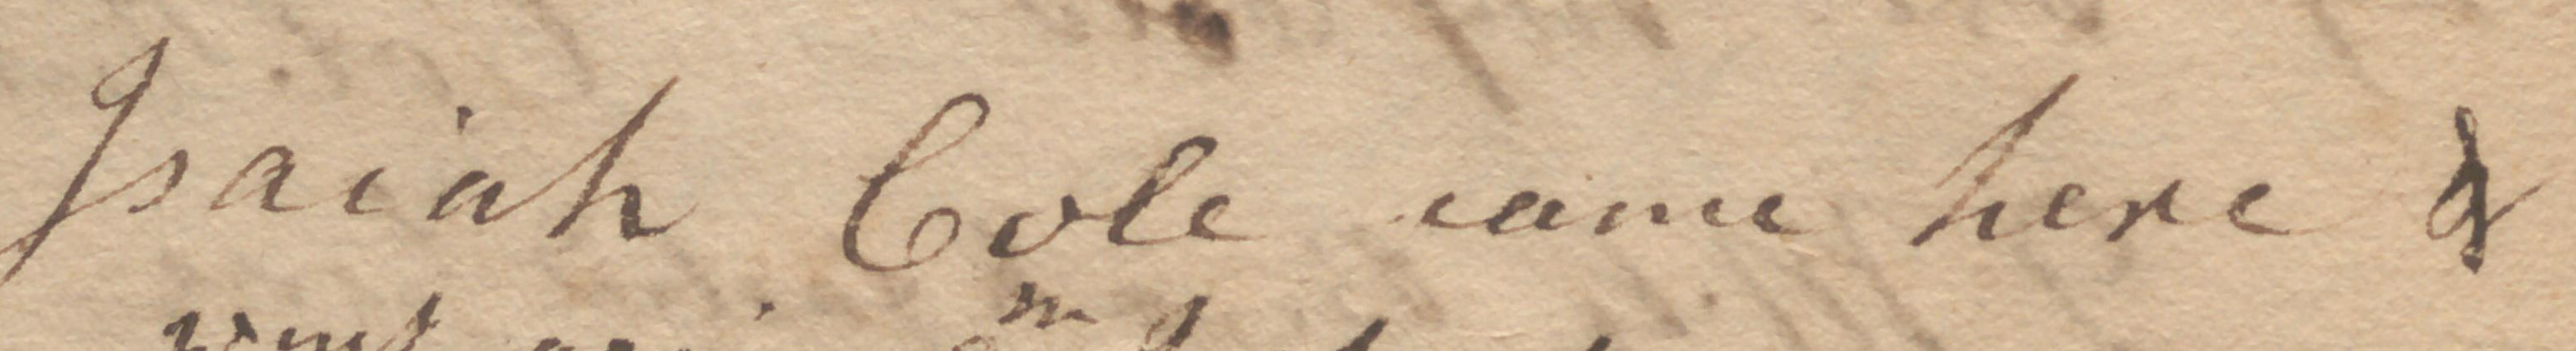Isaiah Cole came here &
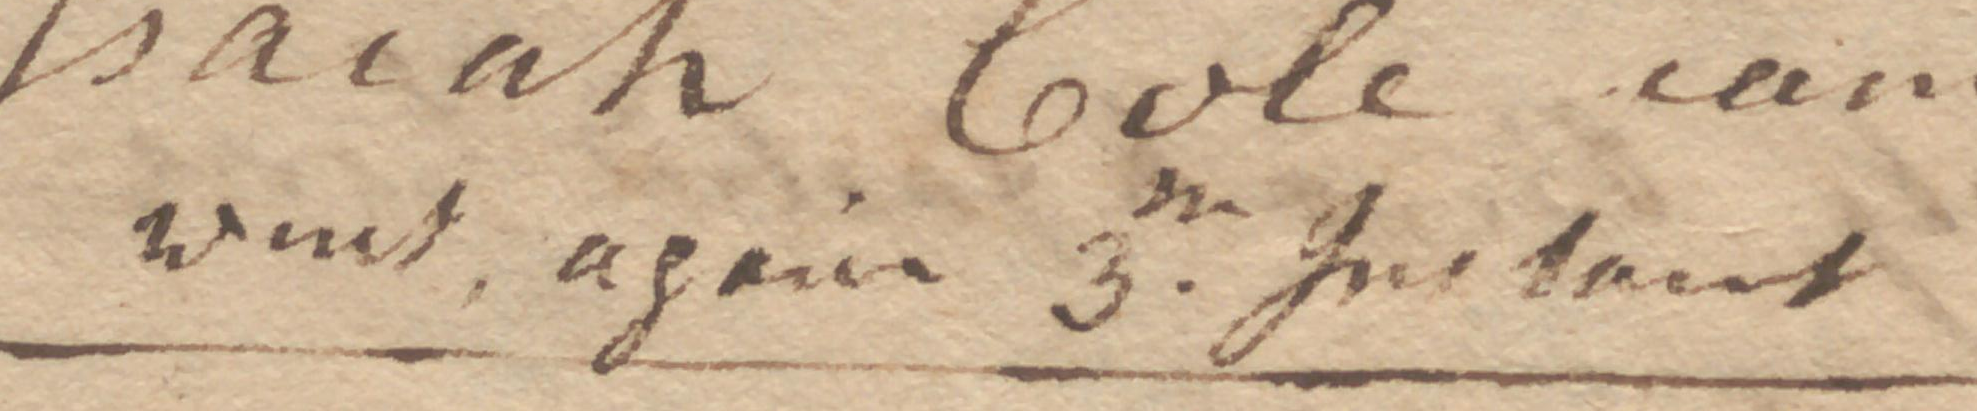went, again 3^th. Instant
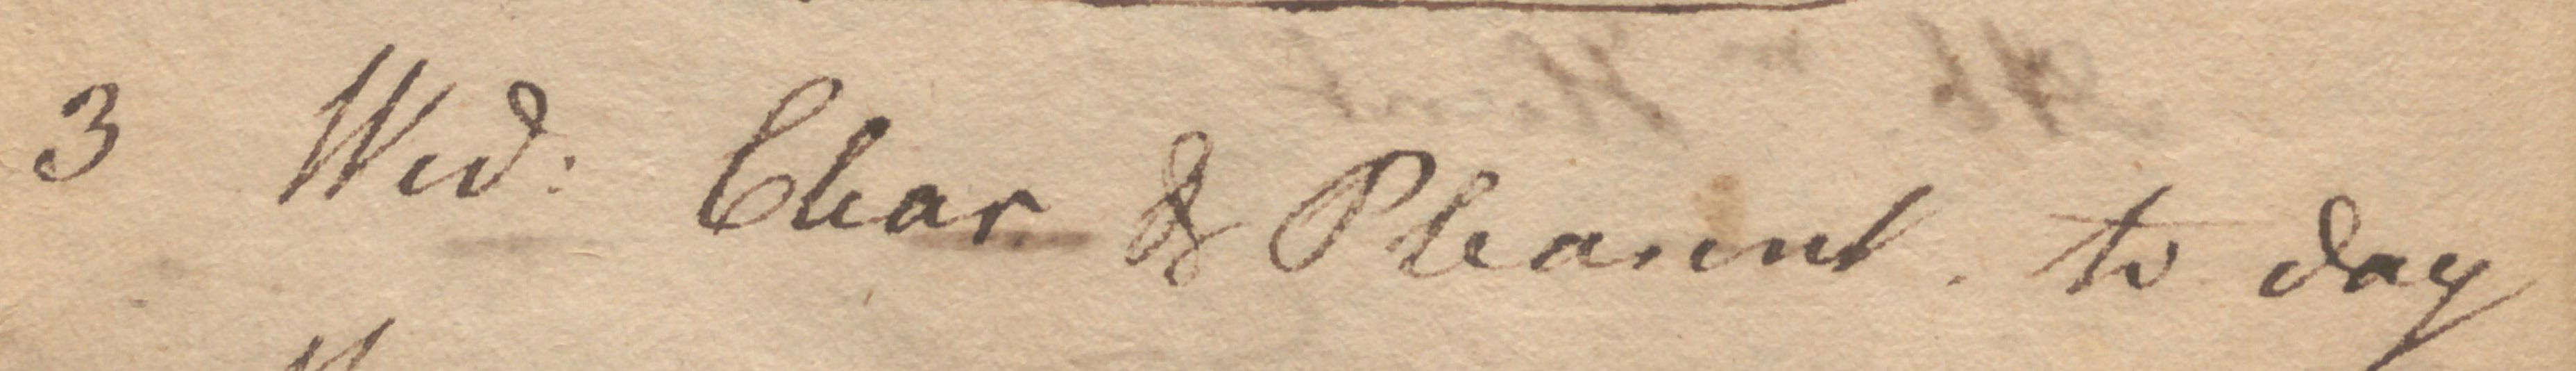3 Wed. Clear & Pleasent to day
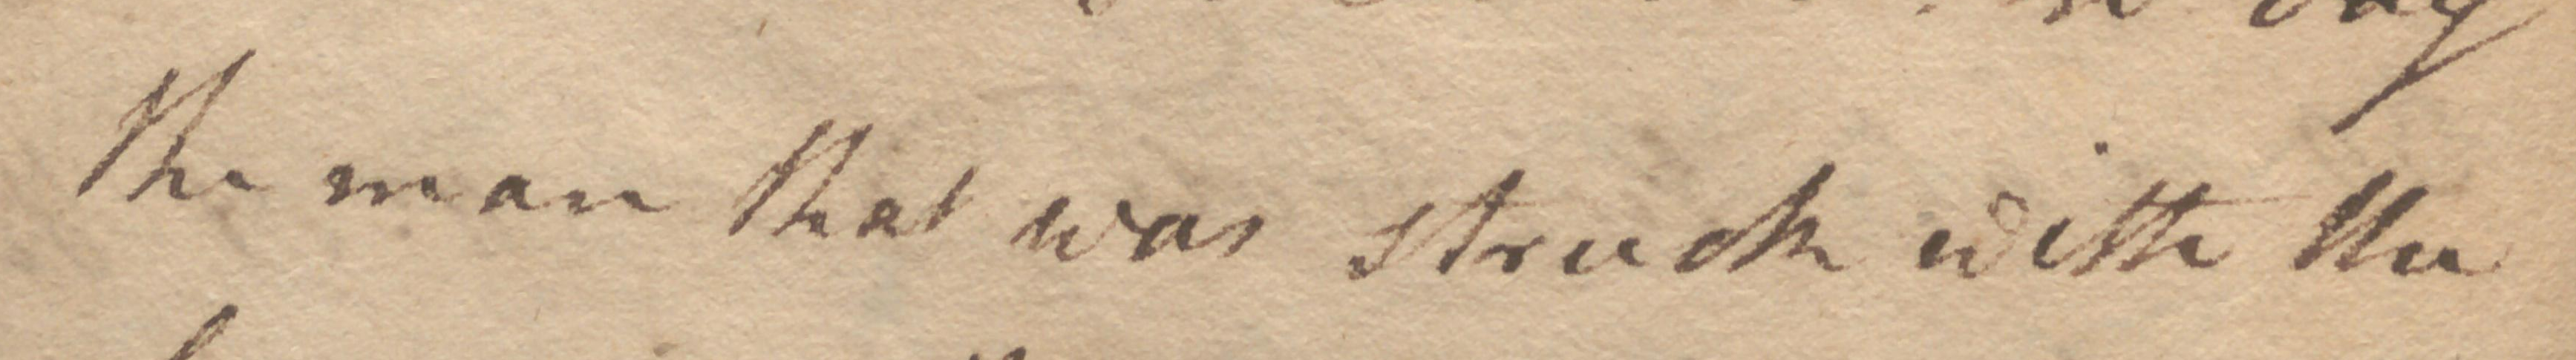the man that was struck with the
